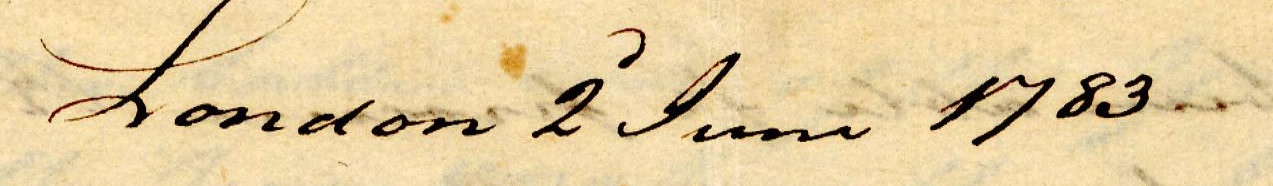London 2^d June 1783
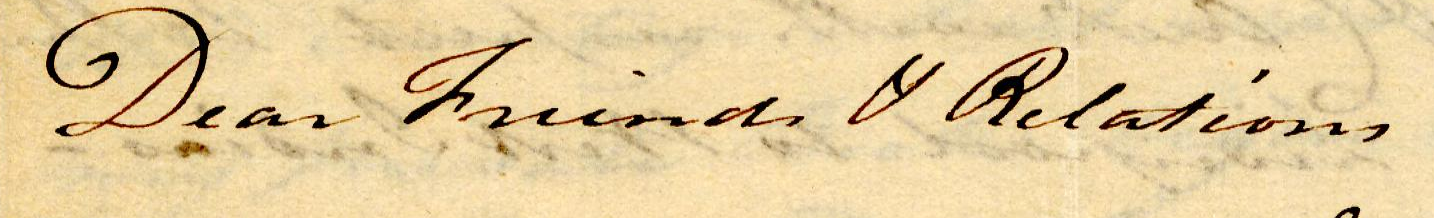Dear Friends & Relations
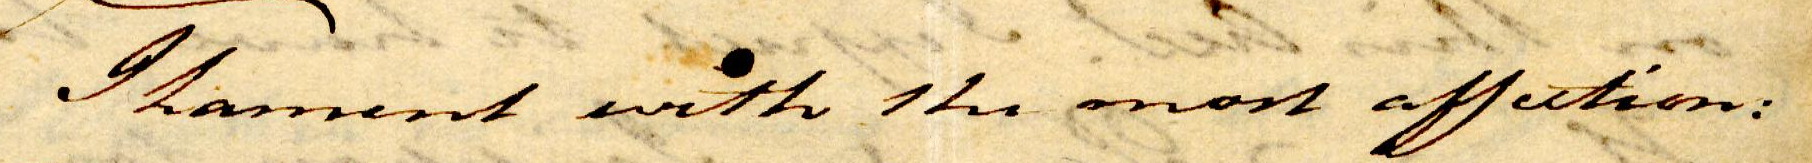I lament with the most affection-
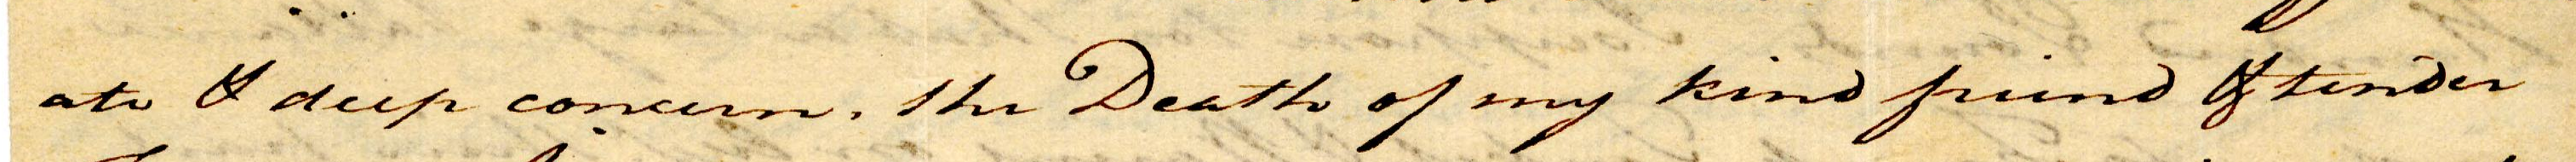-ate & deep concern. the Deaths of my kind friend & tender
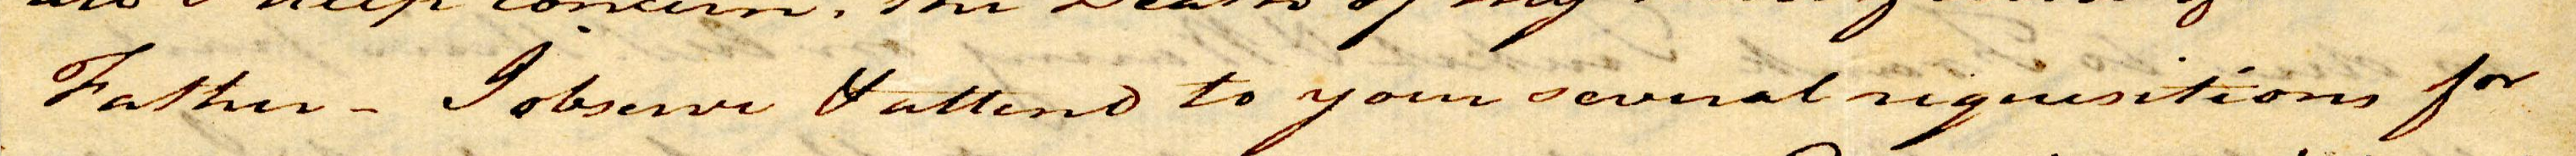Father. I observe & attend to your several requisitions for
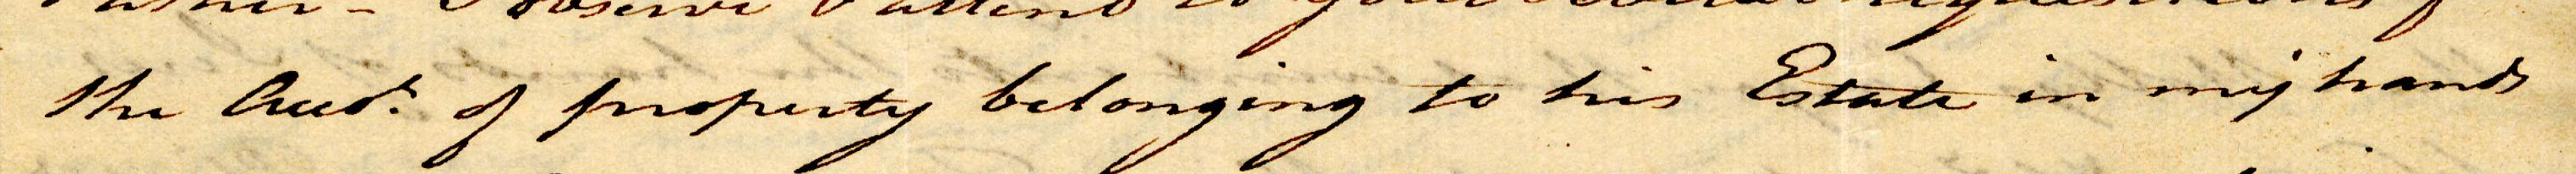the Acco^t. of property belonging to his Estate in my hands
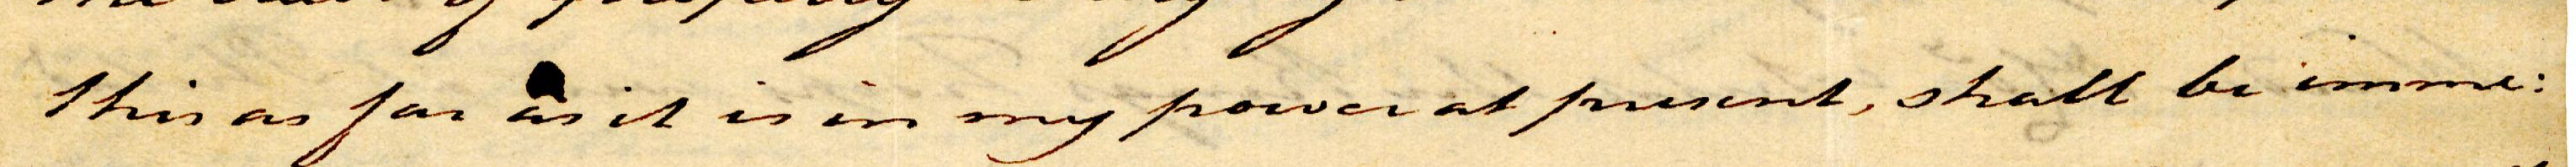This as far as it is in my power at present, shall be imme-
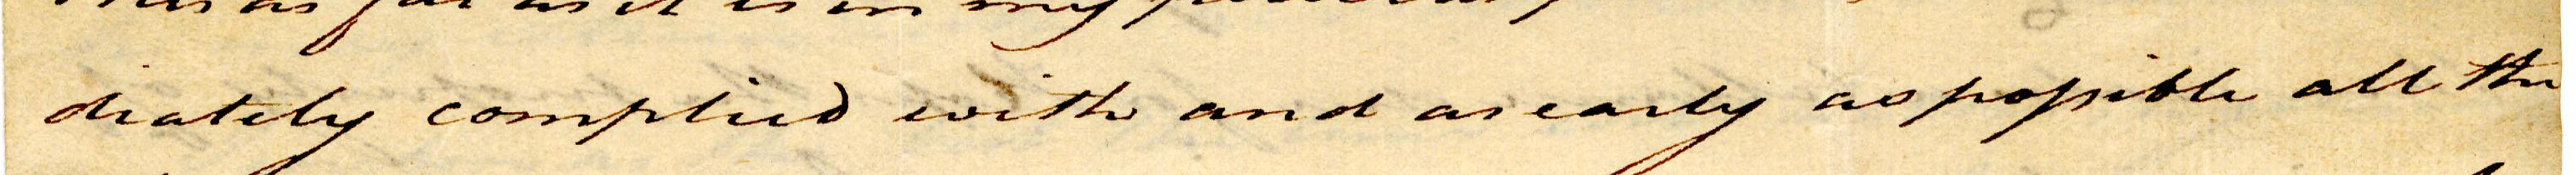diately complied with and as early as possible all the
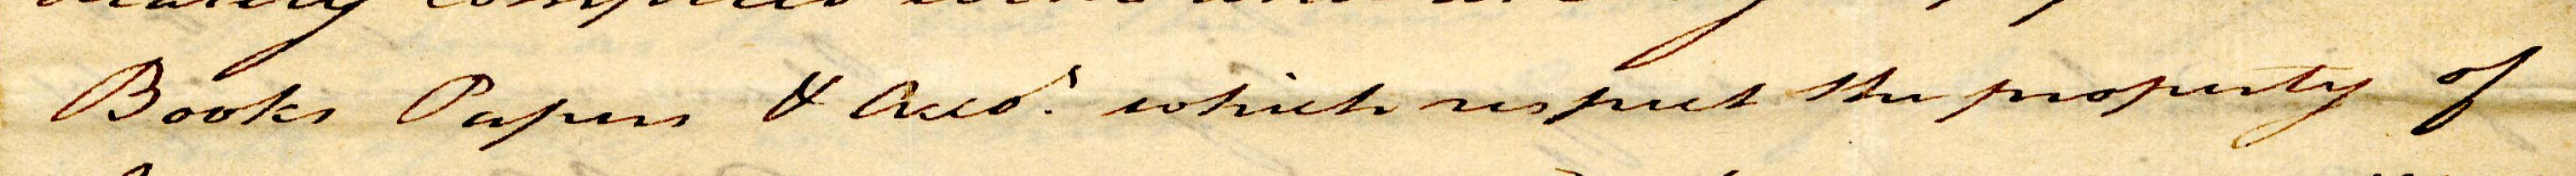Books Papers & Acco^t. which respect the property of
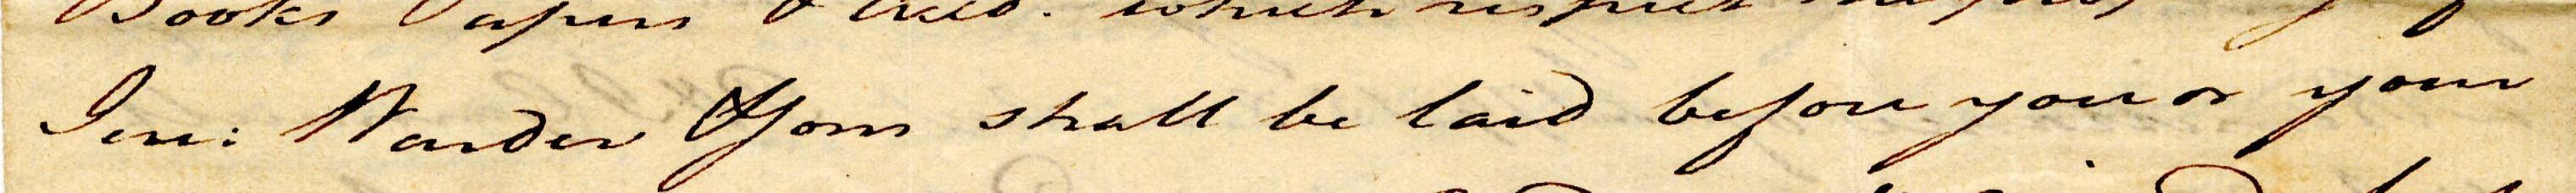Jon: Warder & You shall be laid before you or your
